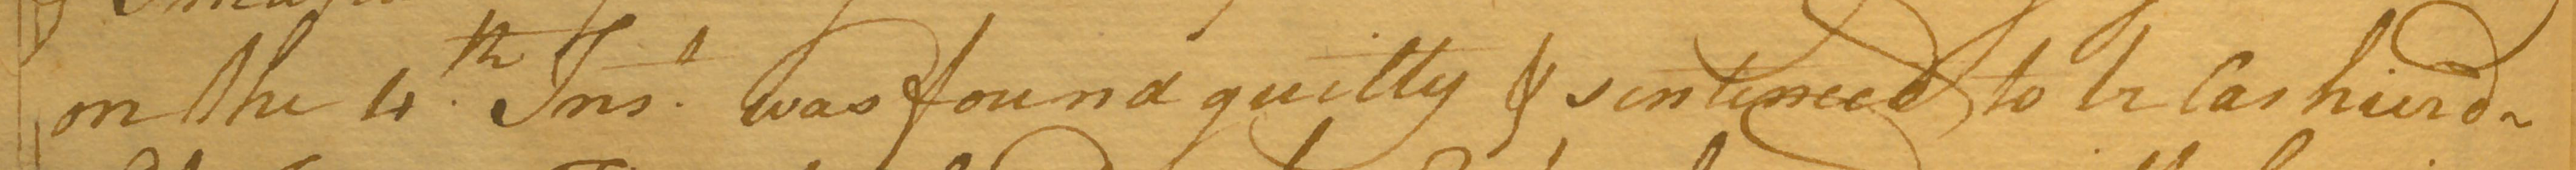on the 4^th. Ins^t. was found guilty & sentenced to be Cashierd-
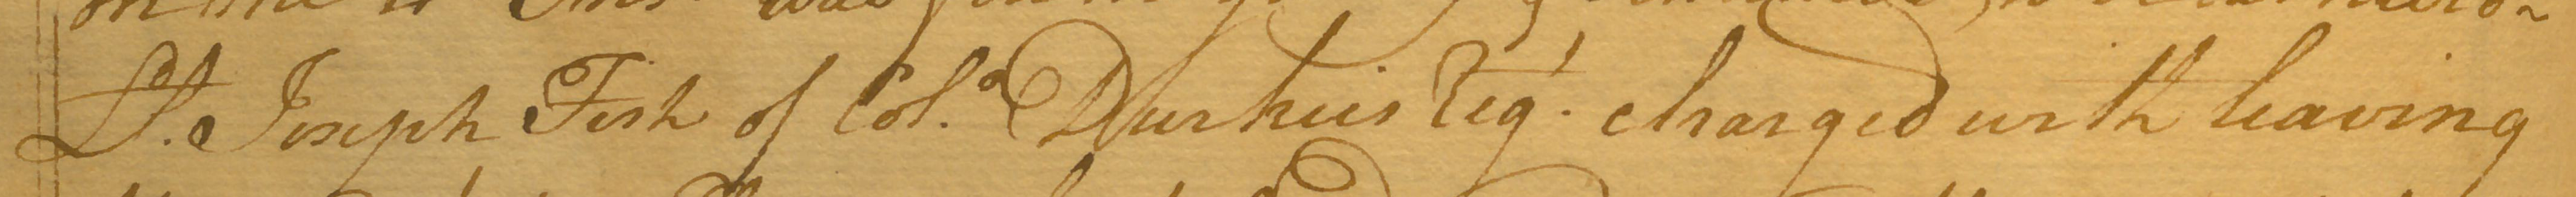L^t. Joseph Fish of Col^o. Durkies Reg^t. charged with leaving
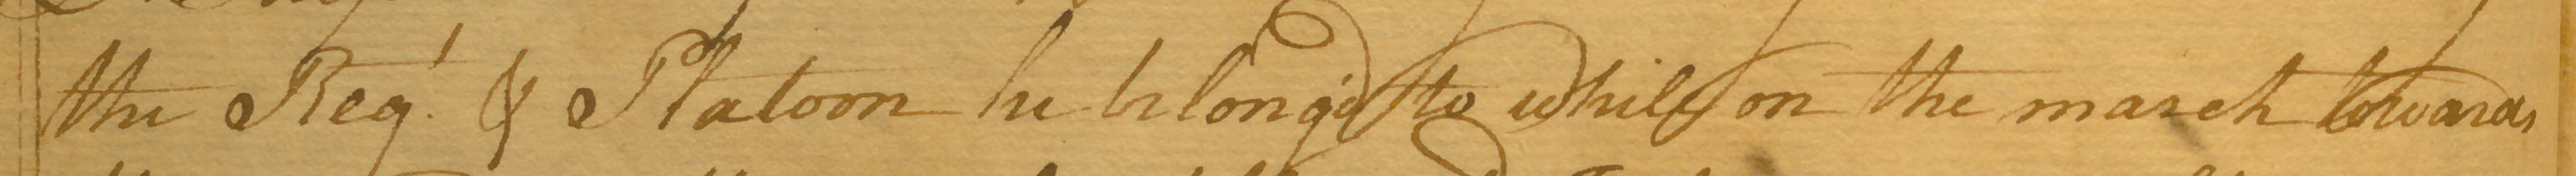the Reg^t. & Platoon he belong'd to while on the march towards
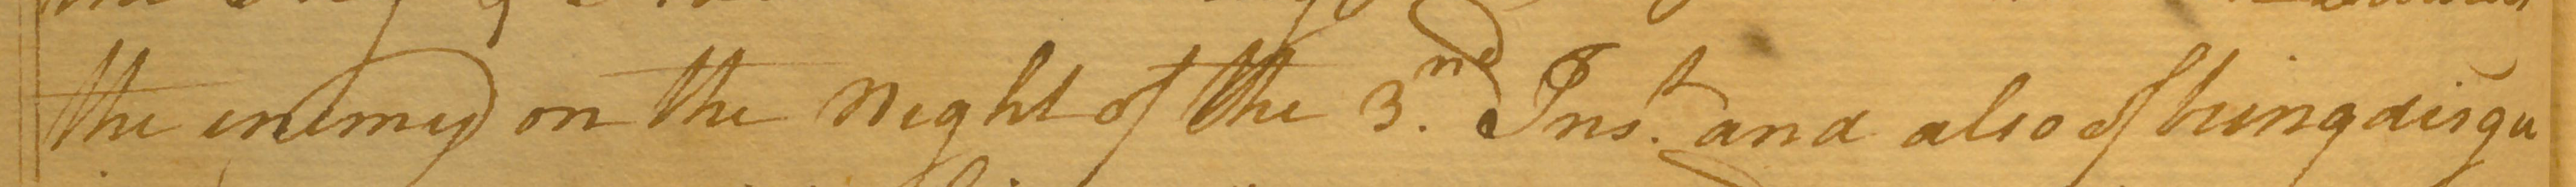the enemy on the night of the 3^rd. Ins^t. and also of being disgu
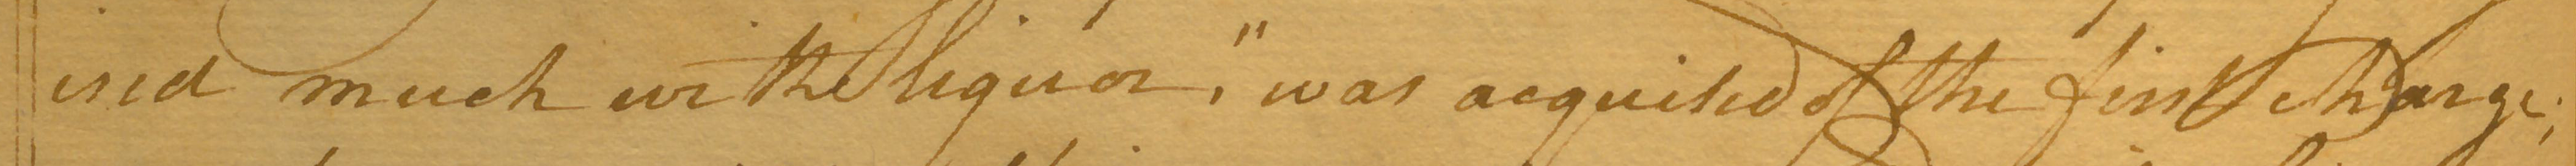ised much in the liquor, "was acquitted of the first charge;
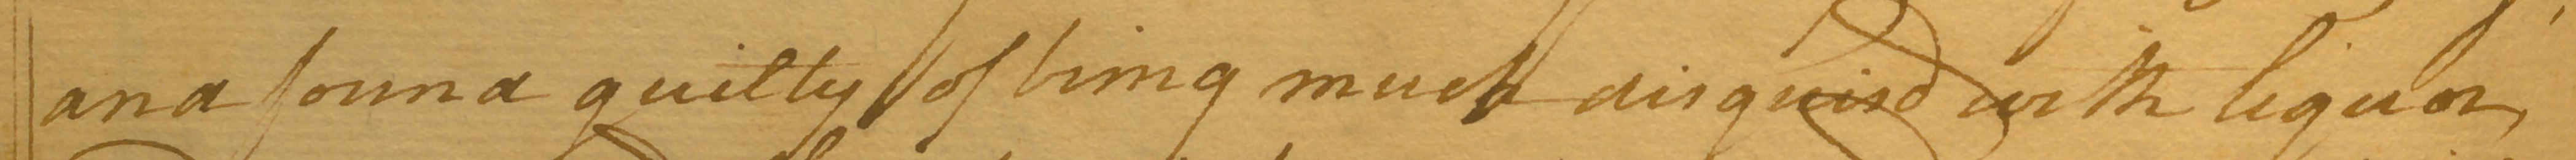and found guilty of being much disguised with liquor,
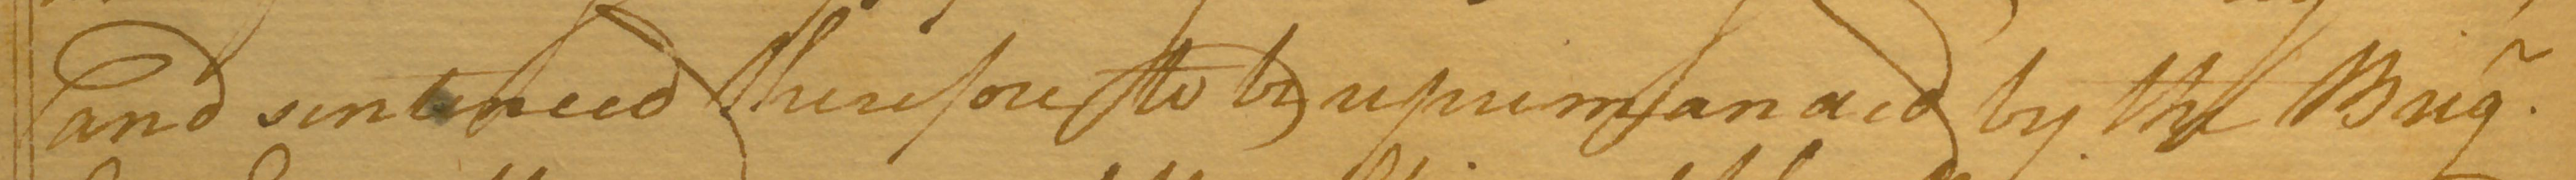and sentenced therefore to be reprimanded by the Brig^r.
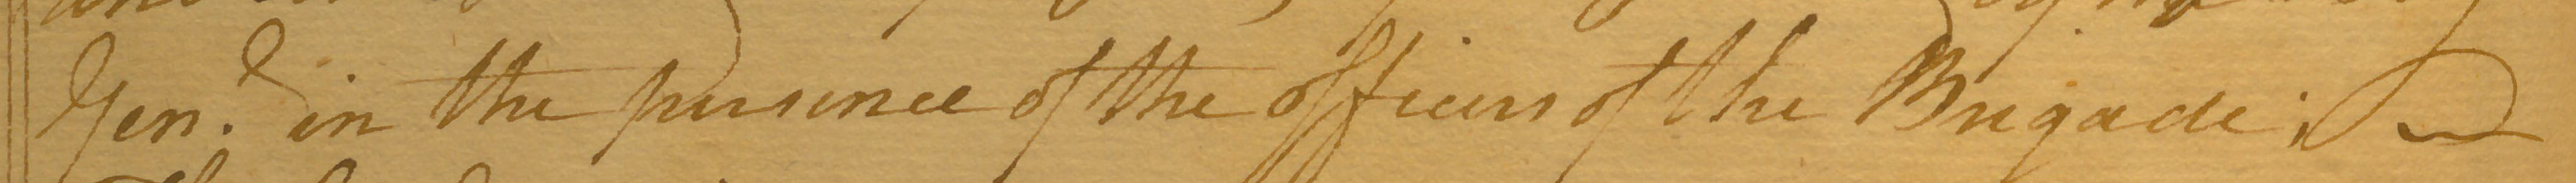Gen^l. in the presence of the officers of the Brigade;-
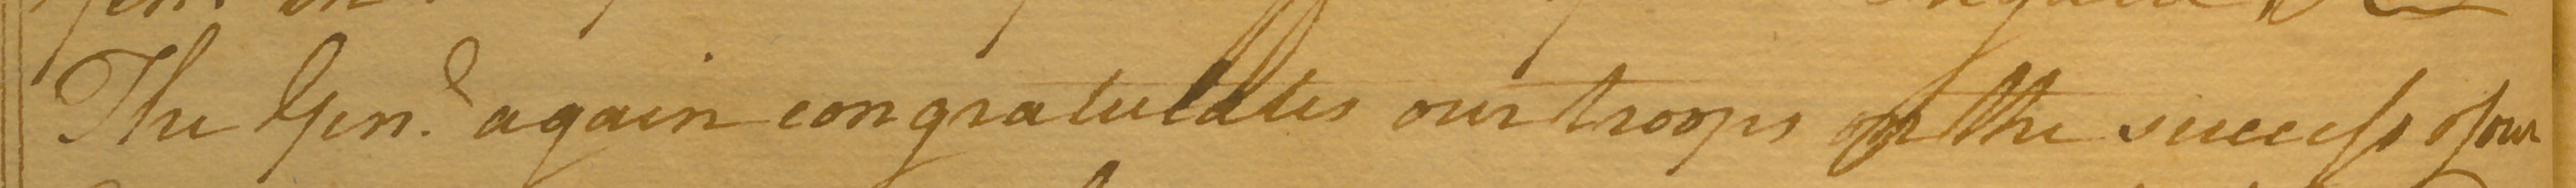The Gen^l. again congratulates our troops on the success of our
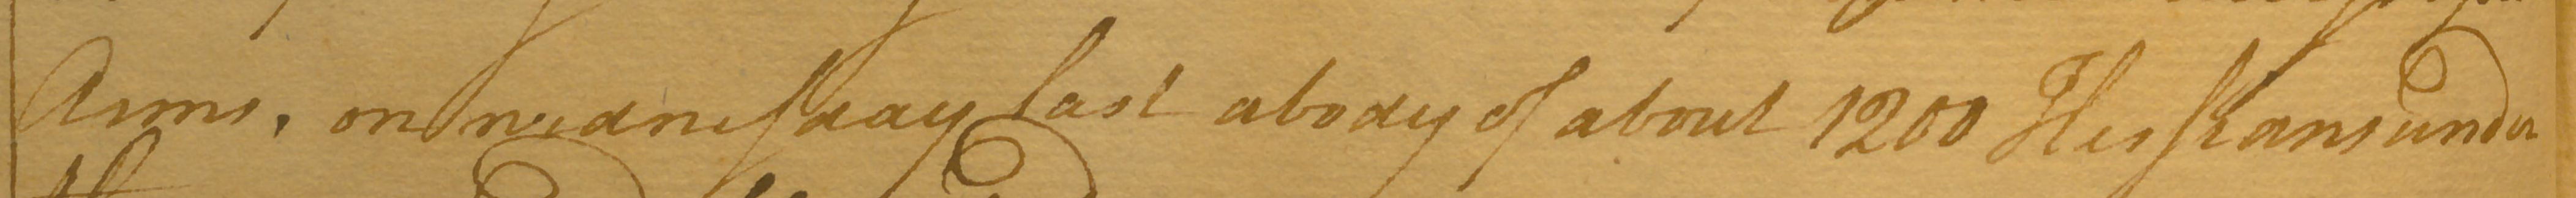Arms, on wednesday last a body of about 1200 Hessians under
